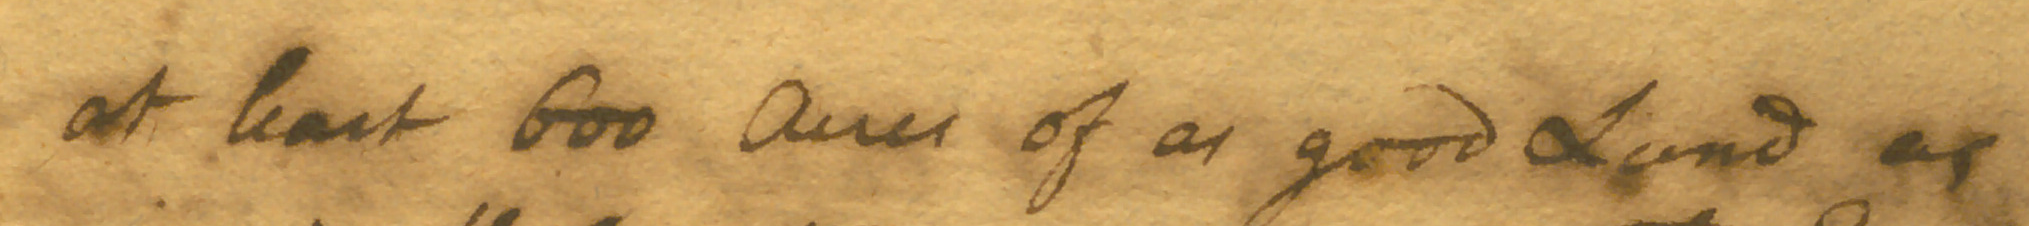at least 600 acres of as good Land as
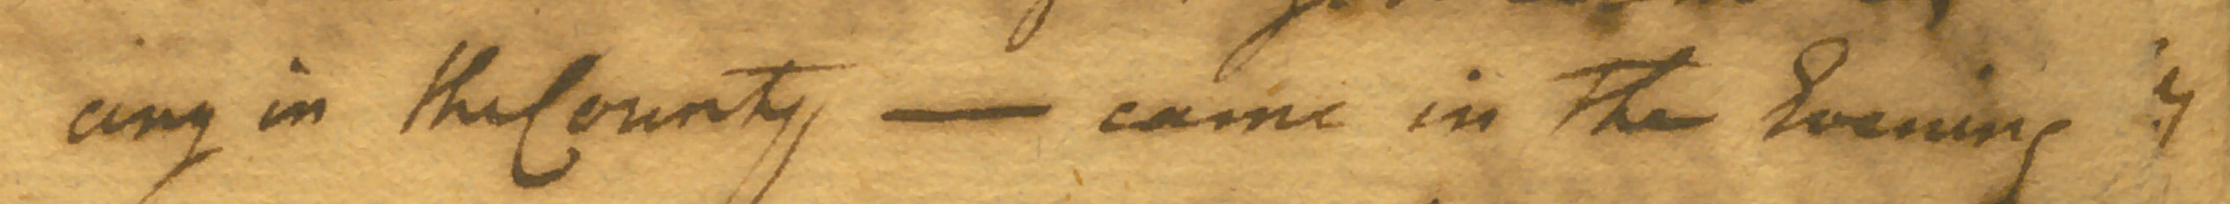any in the Country- came in the Evening
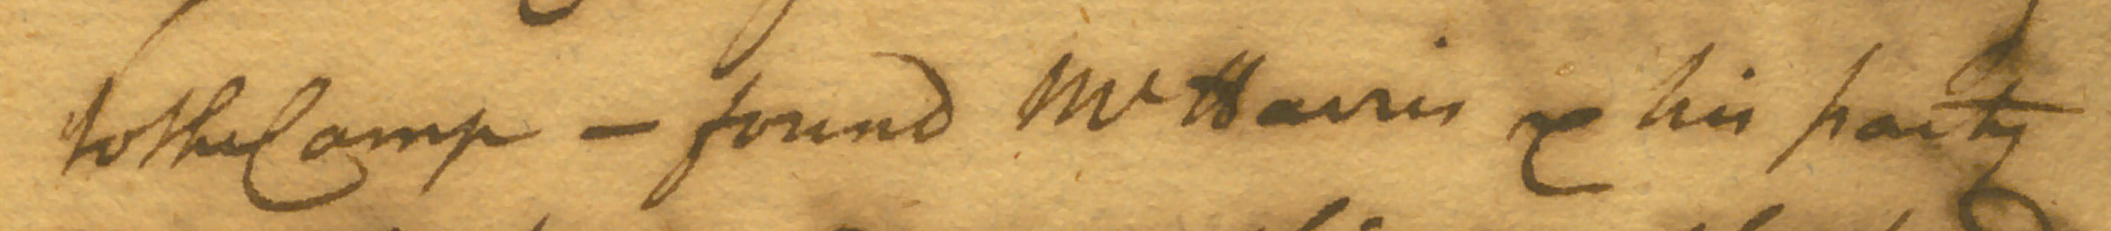to the Camp- found M^r Harris & his party
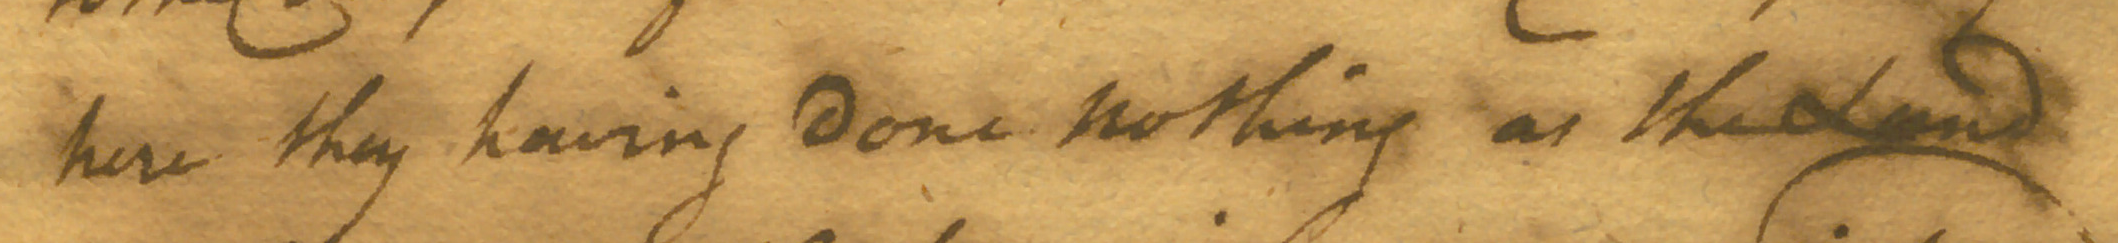here they having done night as the Land
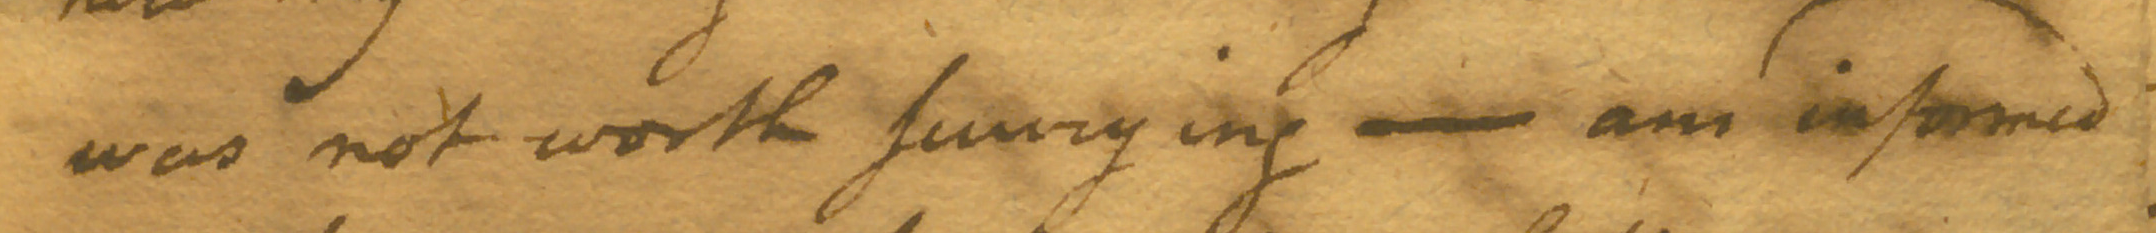was not worth surveying- am informed
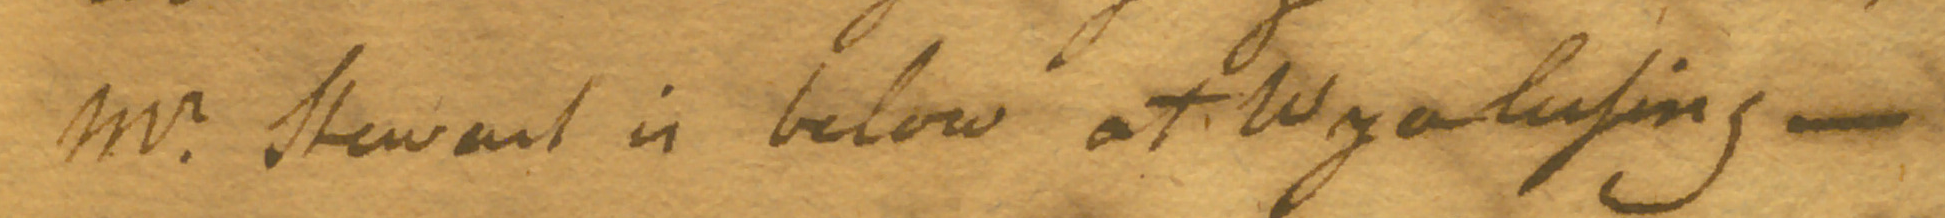M^r. Stewart is below at Wyalusing-
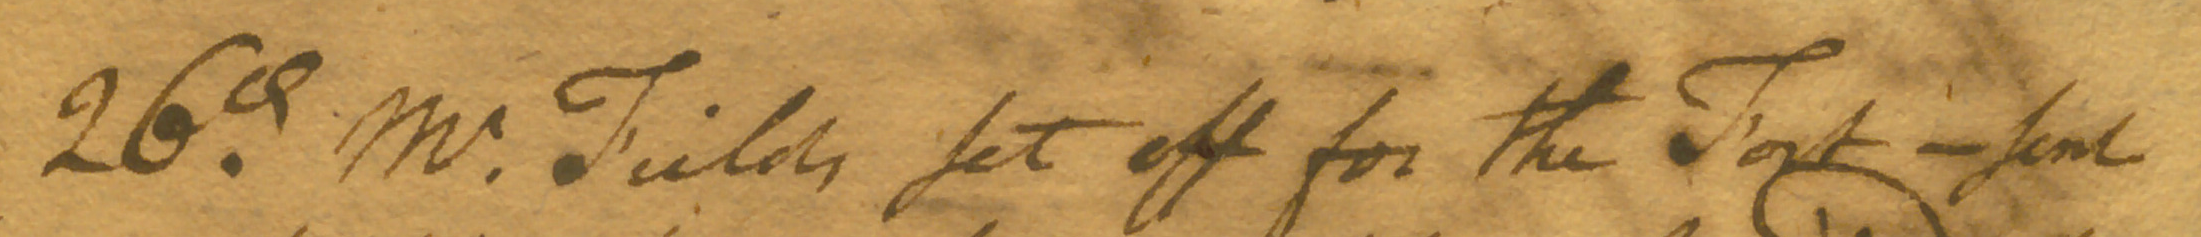26^th. M^r. Fields set off for the Fort- sent
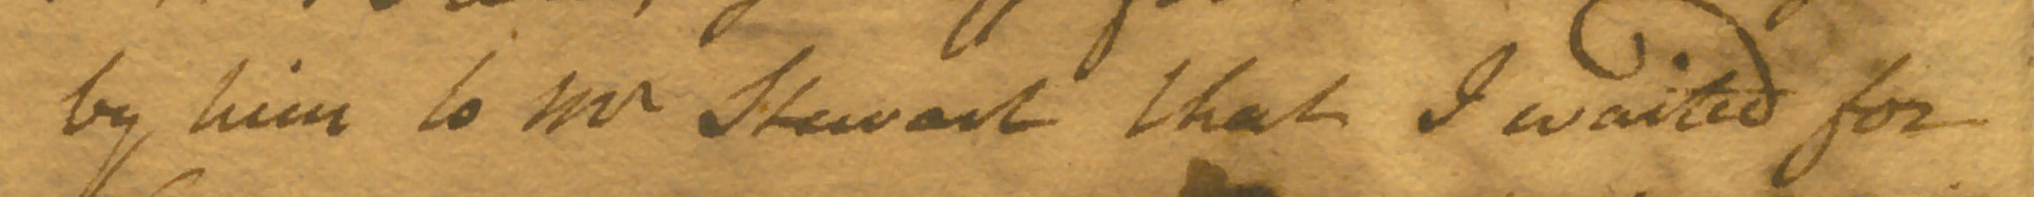by him to M^r Stewart that I waited for
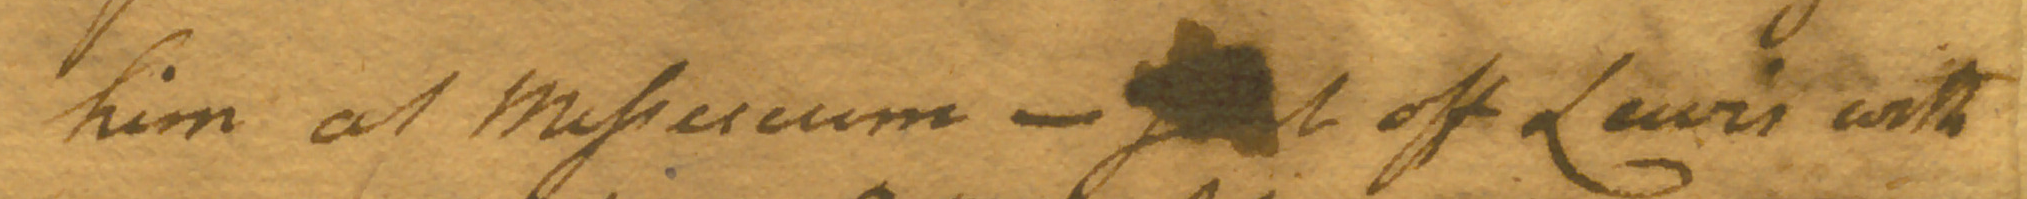him at Messescum- sent off Lewis with
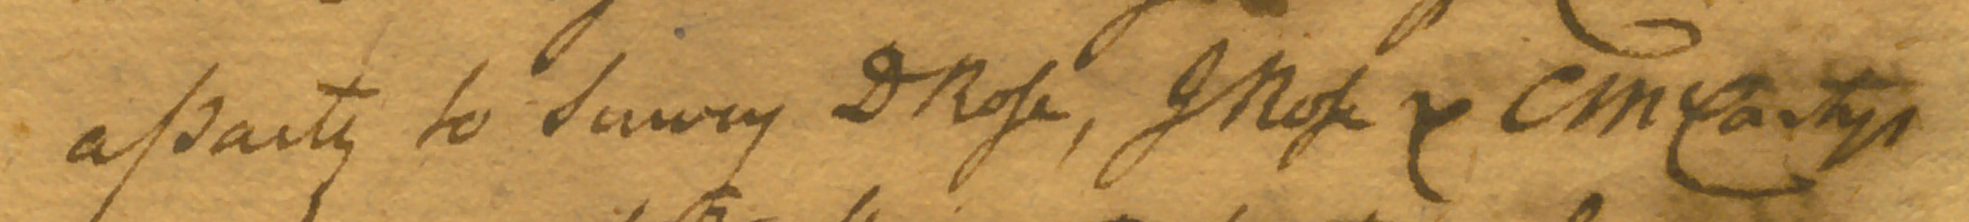a party to survey D Rose, J Rose & C MCartys
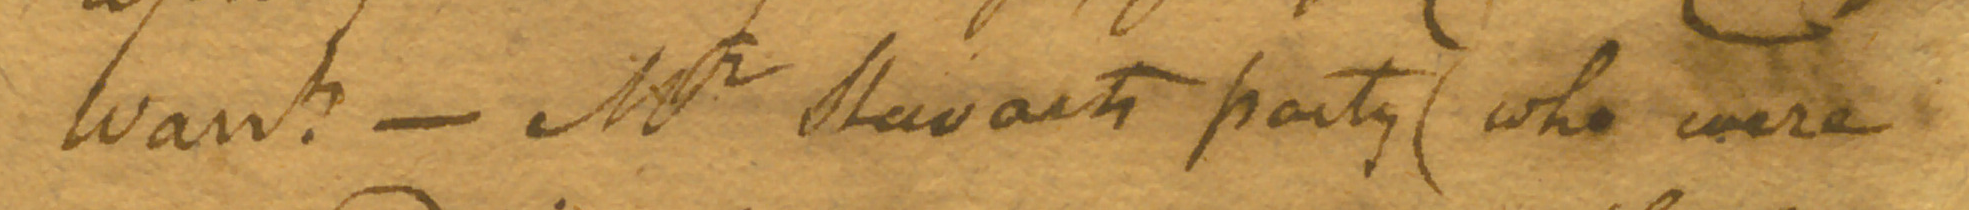warr^t.- M^r Stewarts party (who were
